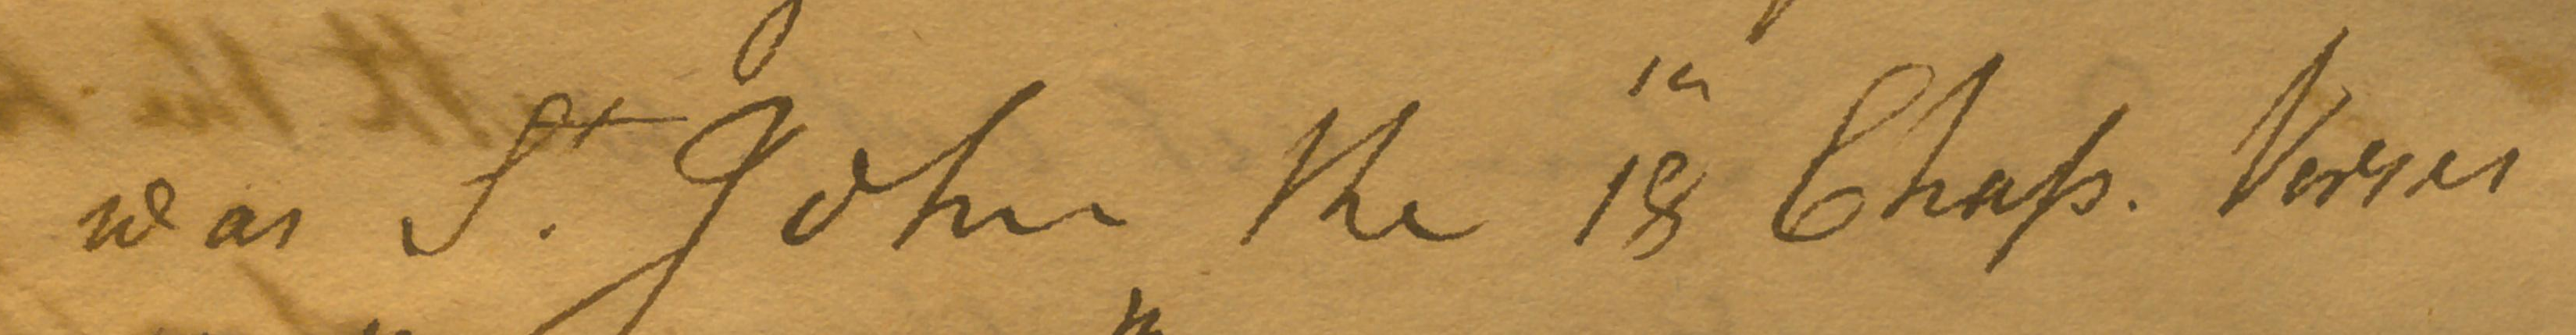was S^t. John the 18^th Chap. Verses
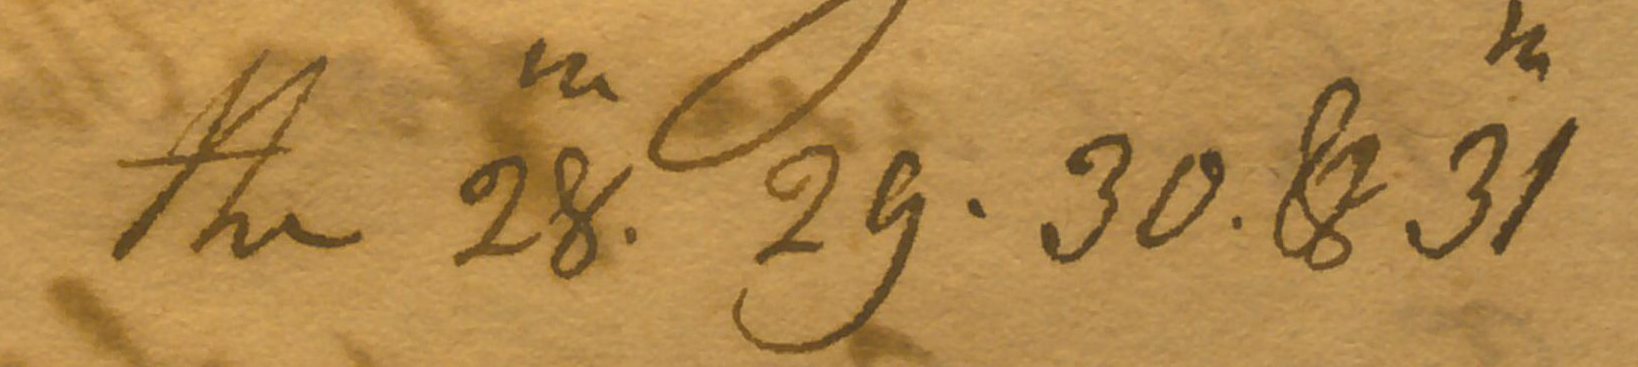The 28^th. 29. 30. & 31^th
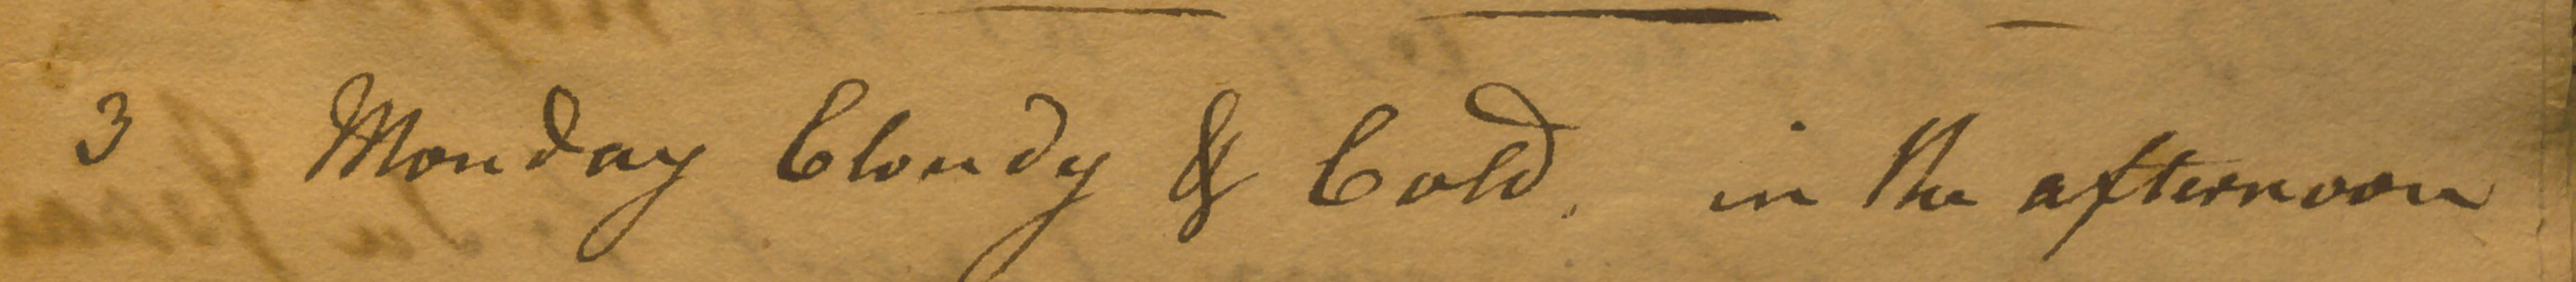3 Monday Cloudy & Cold, in the afternoon
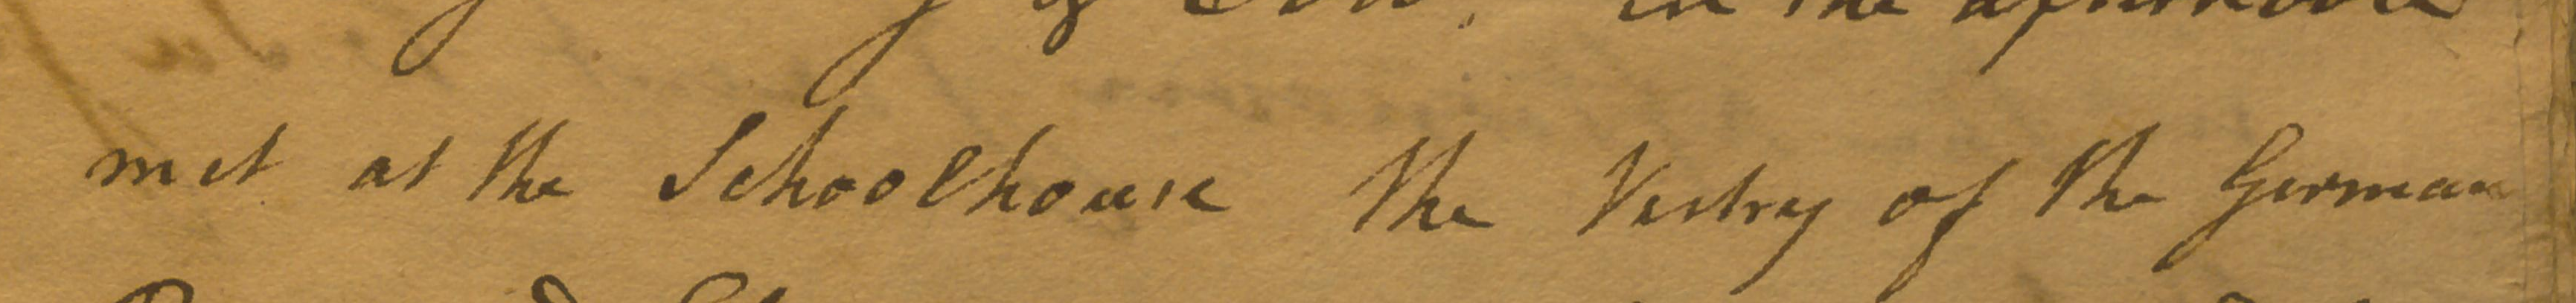met at the Schoolhouse the Vestry of the German
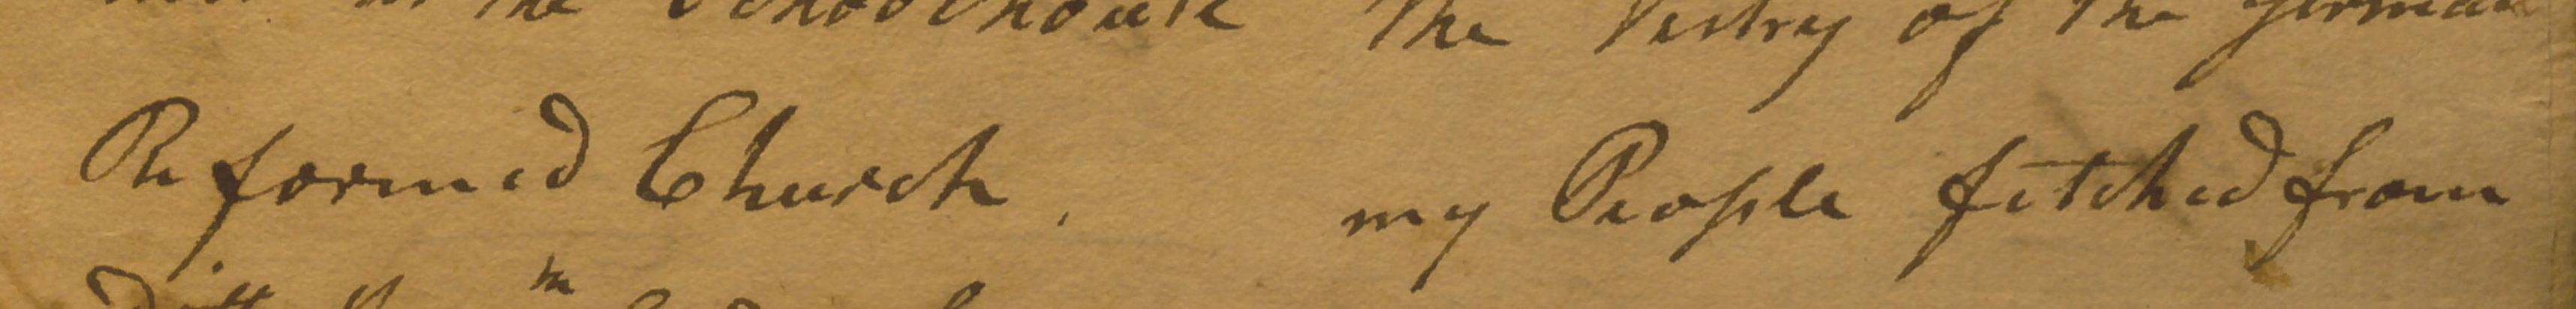Reformed Church. my People fetched from
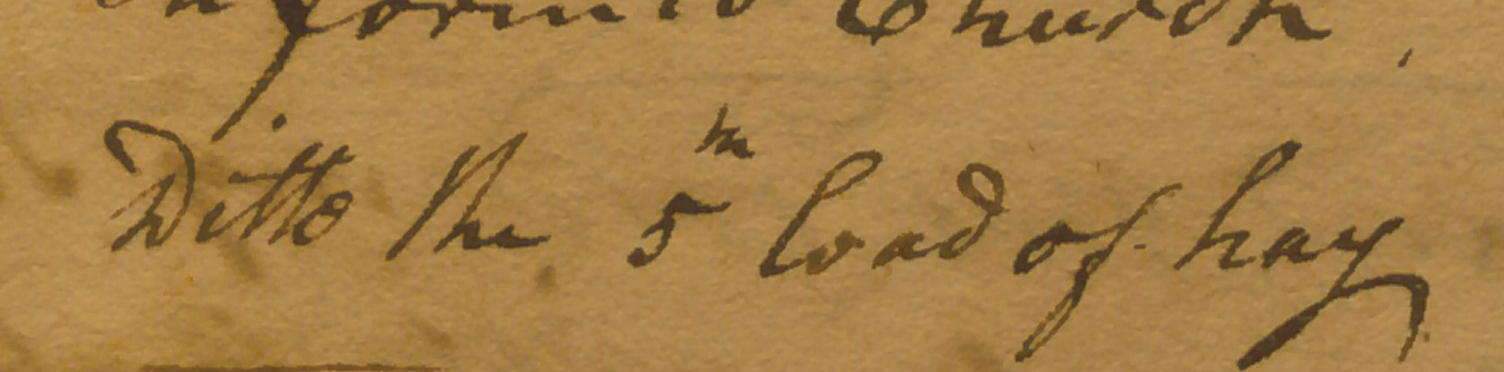Dito the 5^th load of hay
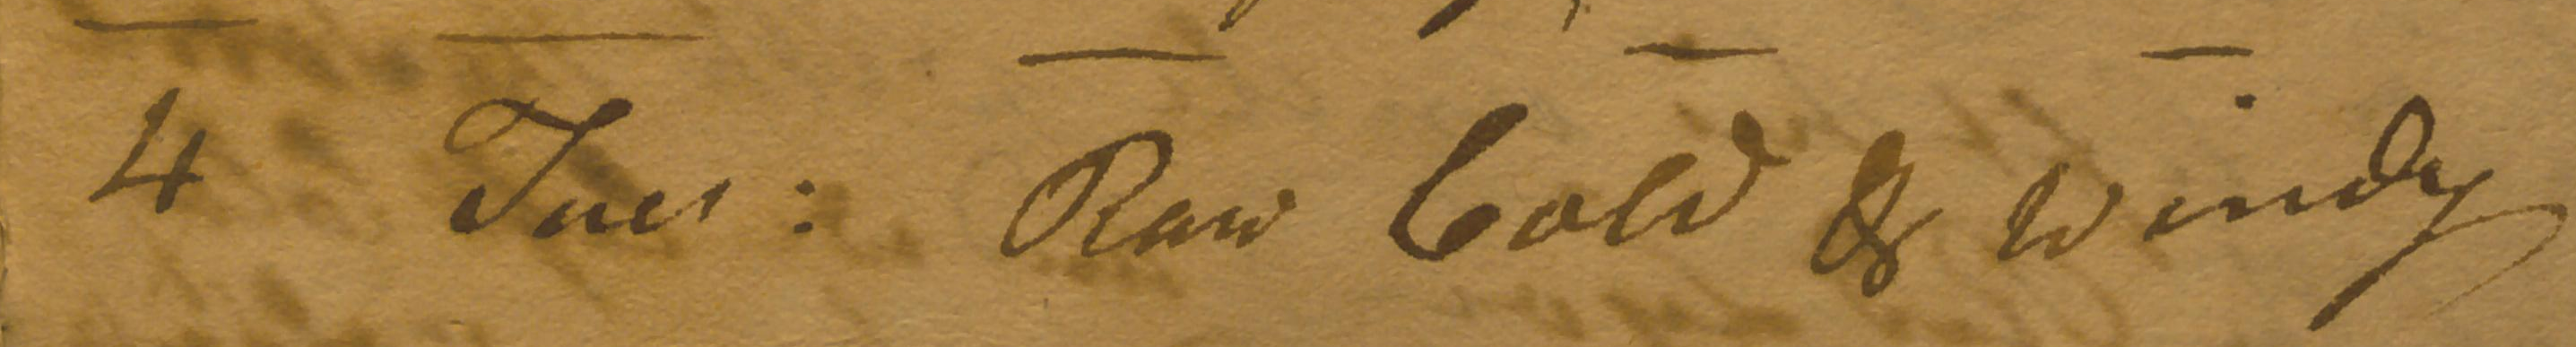4 Tues: Raw Cold & windy
